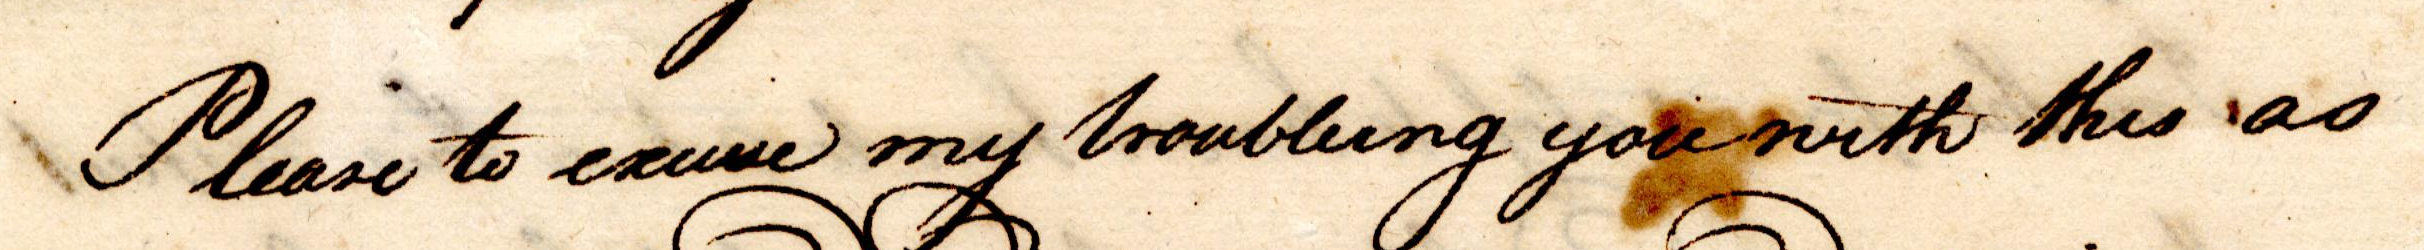Please to excuse my troubling you with this as
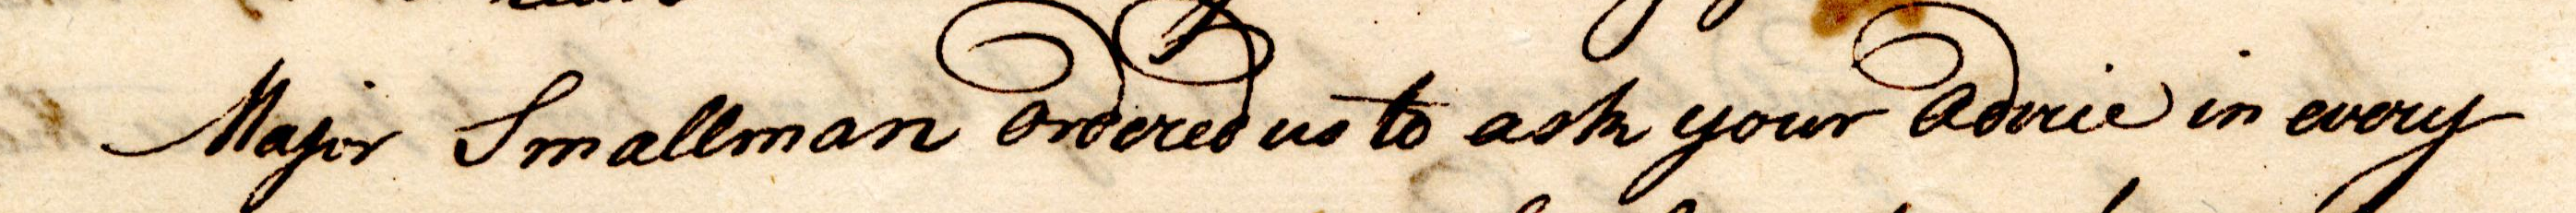Major Smallman ordered us to ask your advice in every
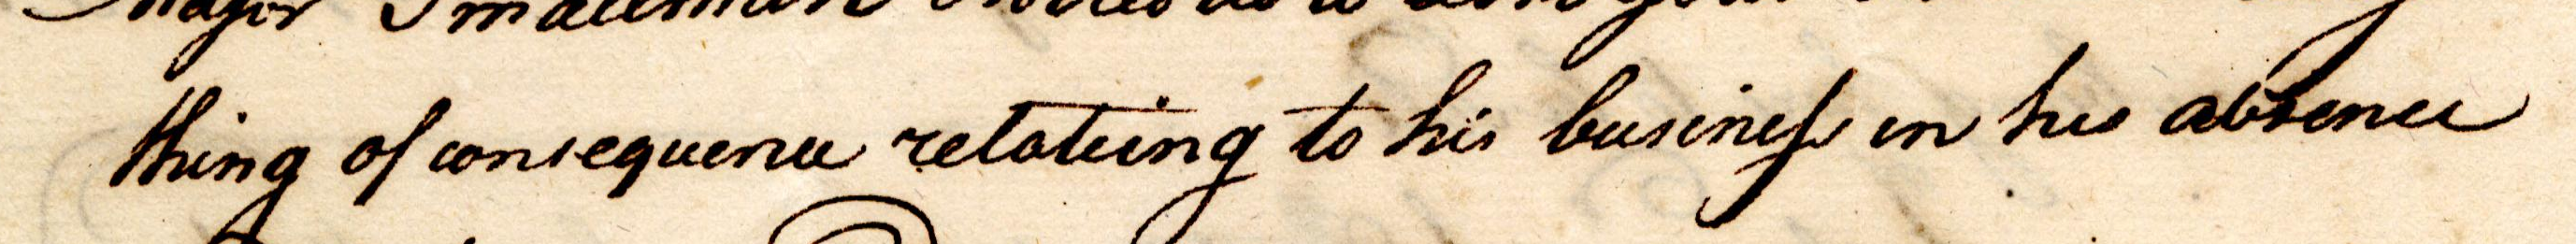thing of consequence relating to his business in his absence
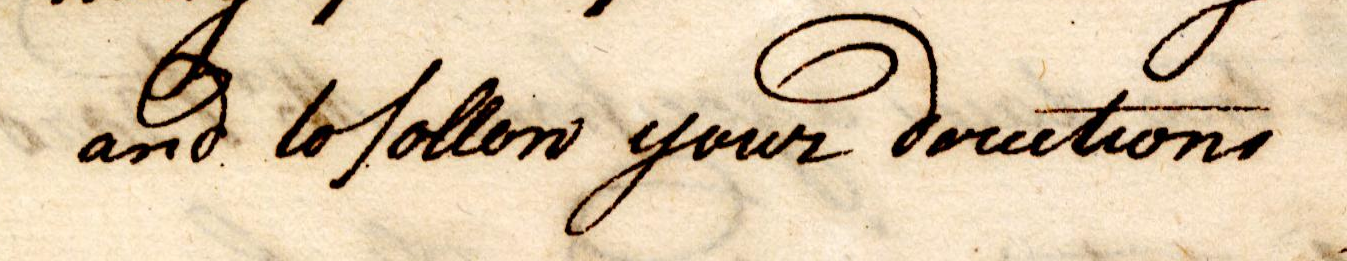and to often your directions
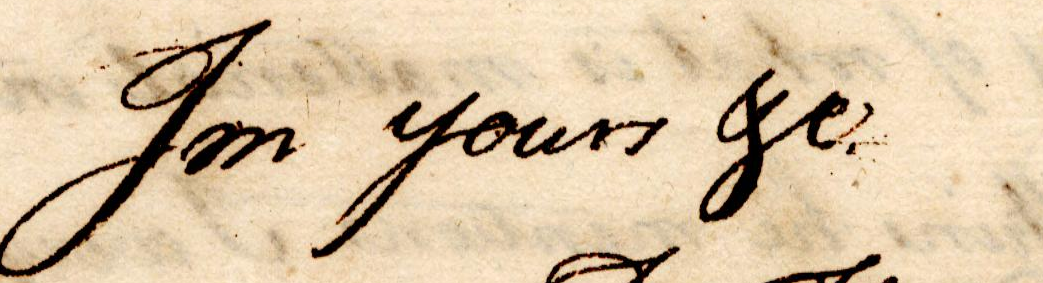Im yours &c.
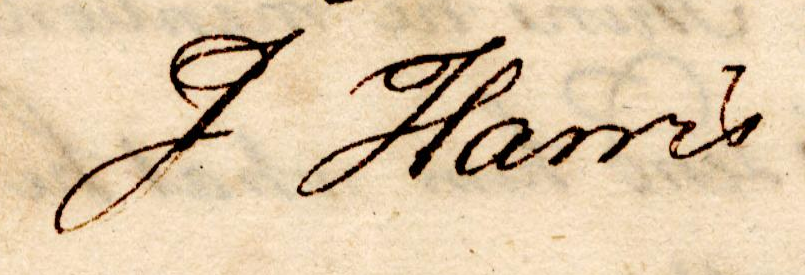J Harris
